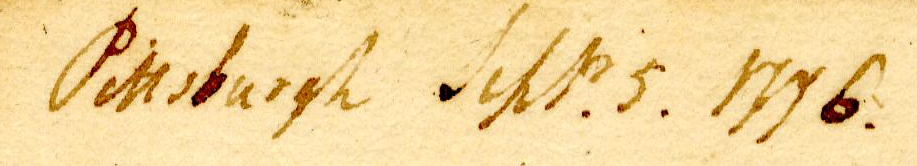Pittsburgh Sept^r. 5. 1776.
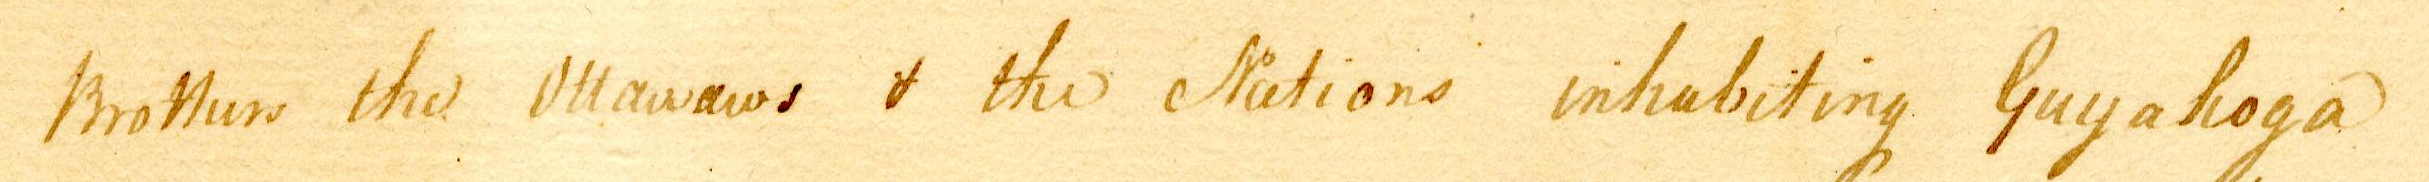Brothers the Ottawaws & the Nations inhabiting Cuyahoga
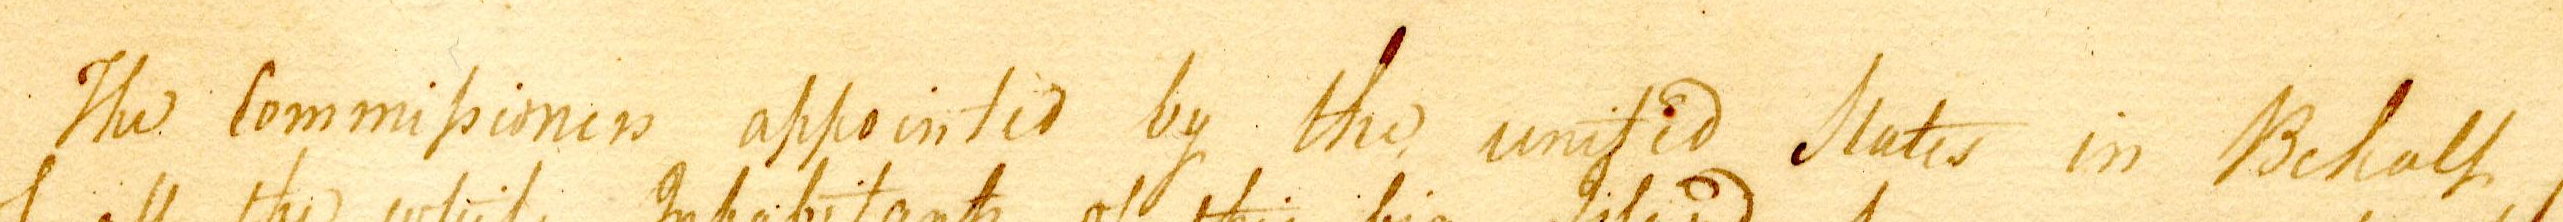The Commissioners appointed by the united States in Behalf
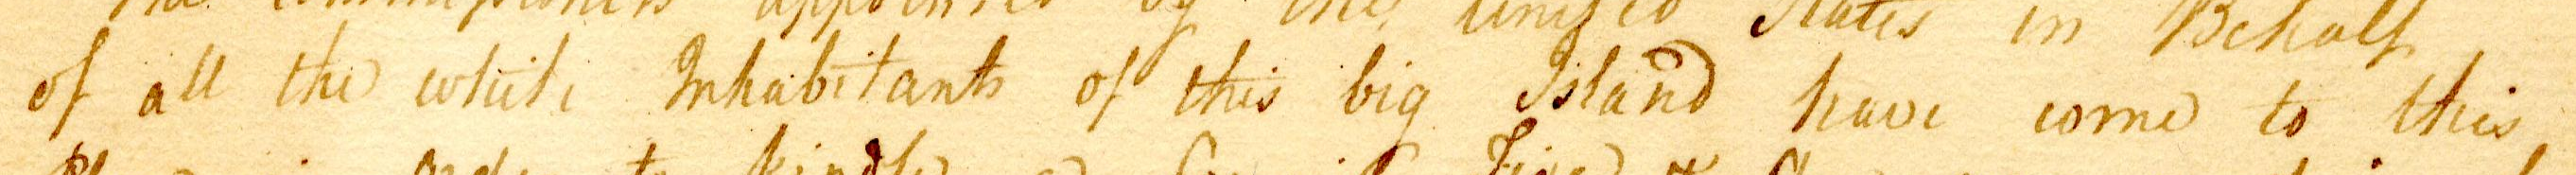of all the white Inhabitants of this big Island have come to this
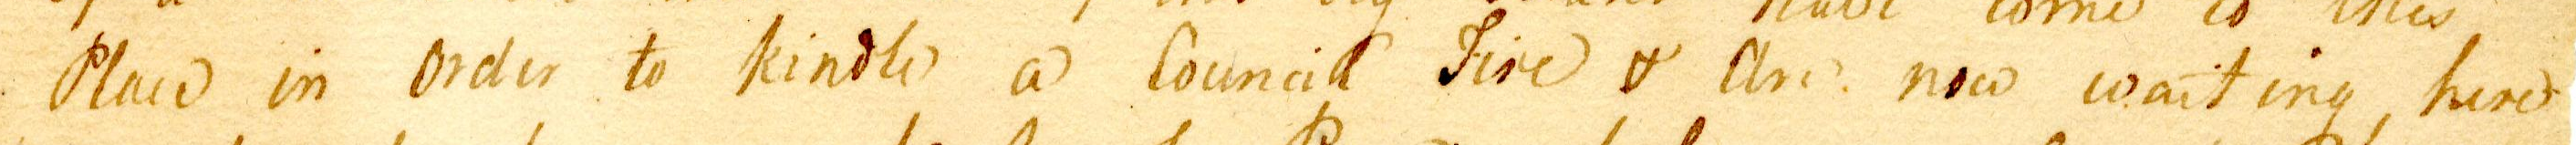Place in order to kindle a Council Fire & Are now waiting here
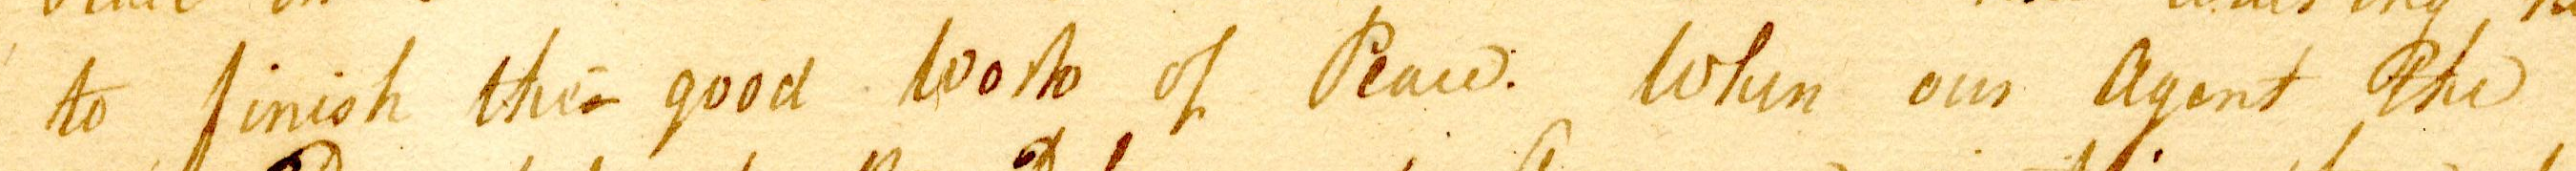to finish this good work of Peace. When our agent the
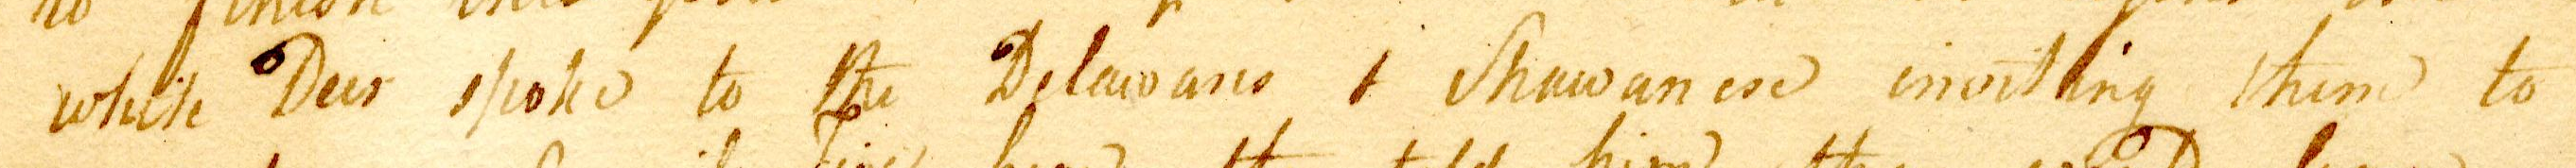white Deer spoke to the Delaware & Shawanese inviting them to
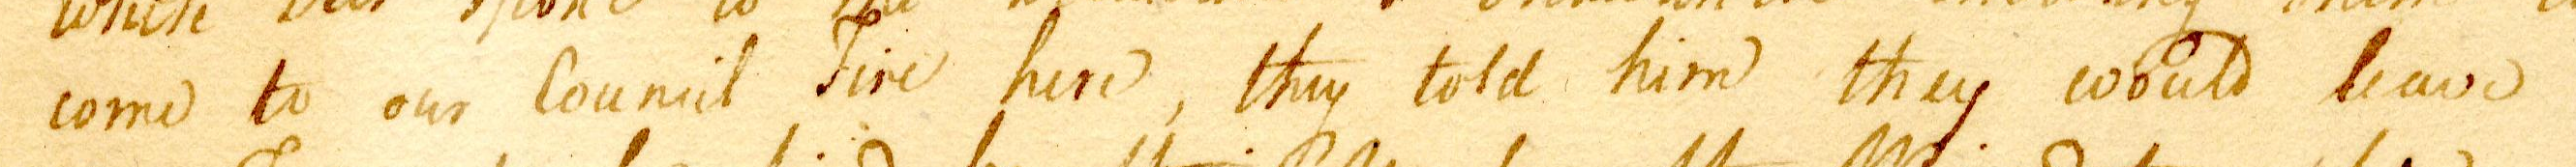come to our Council Fire here, they told him they would leave
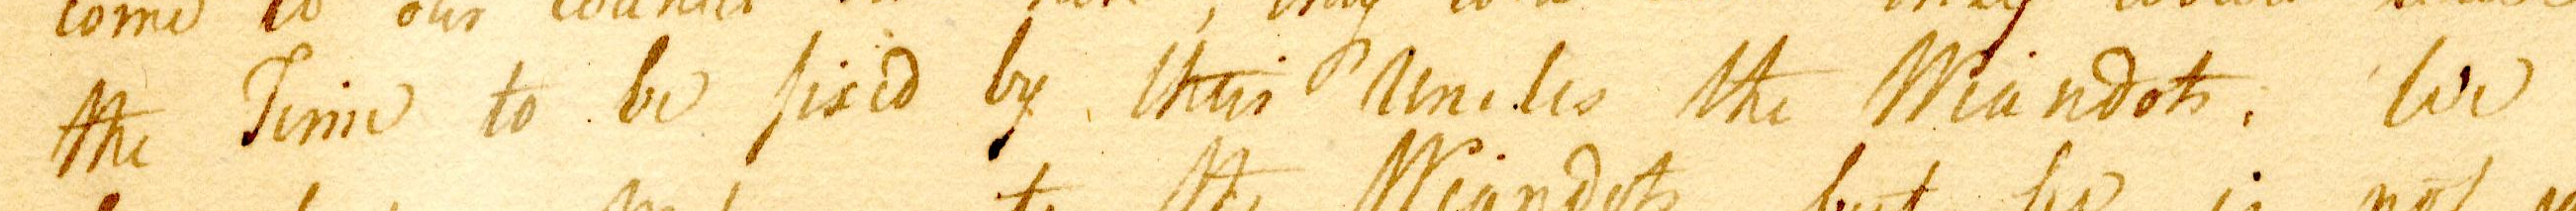the Time to be fixed by their Uncles the Wiandots; We
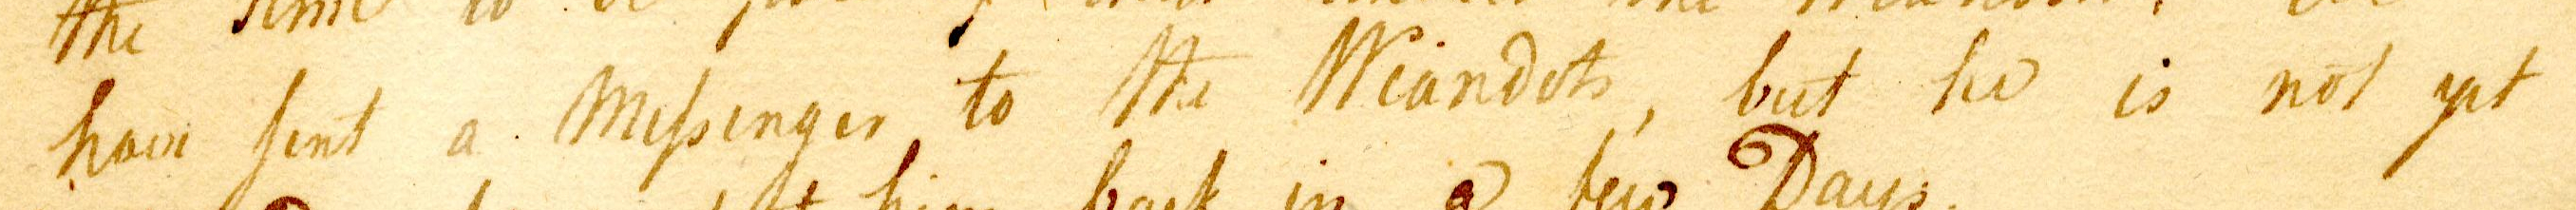have sent a Messenger to the Wiandots, but he is not yet
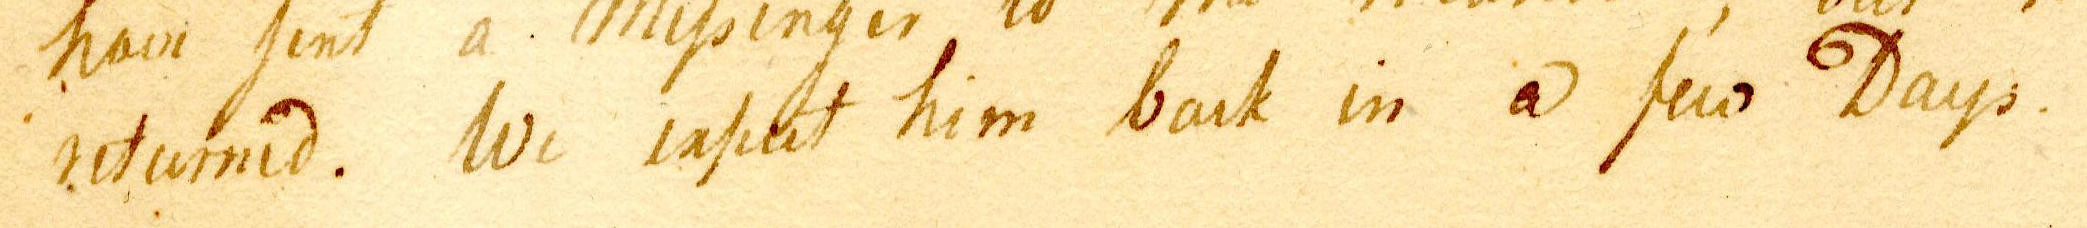returned. We expect him back in a few Days.
